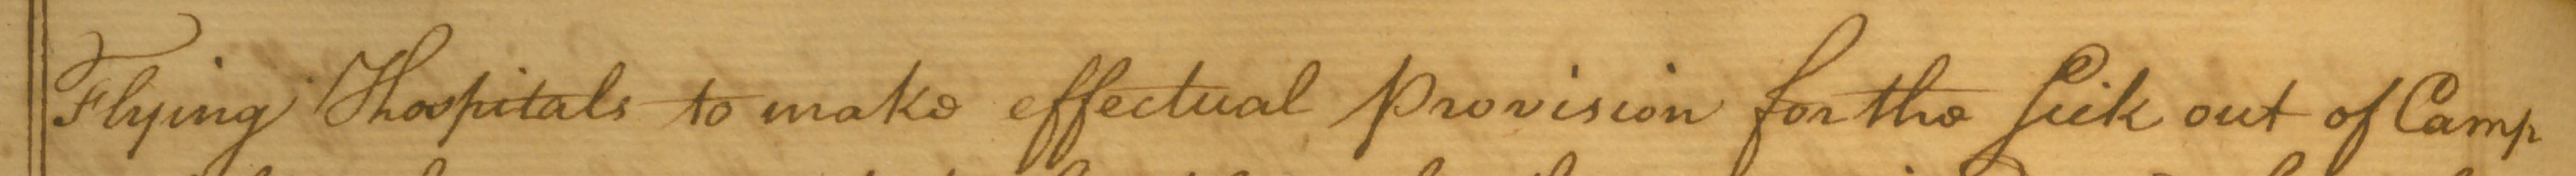Flying Hospitals to make effectual provision for the sick out of Camp
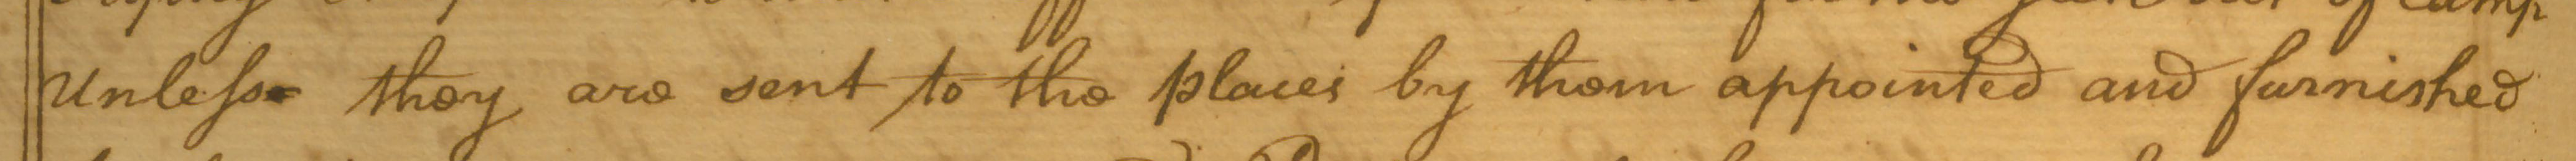unless they are sent to the places by them appointed and furnished
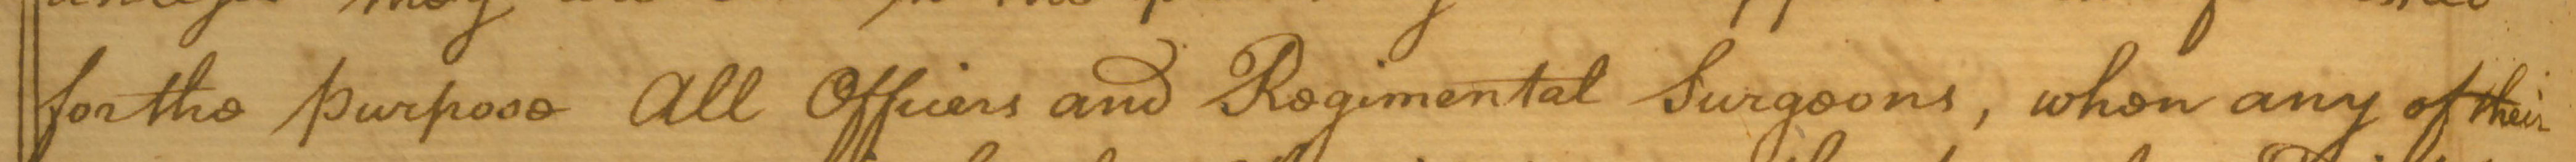for the purpose All Officers and Regimental Surgeons, when any of their
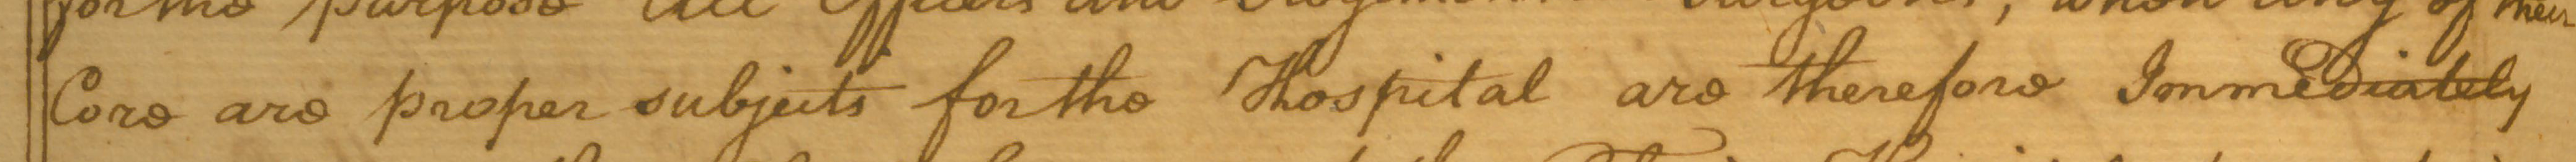Core are proper subjects for the Hospital are therefore Immediately
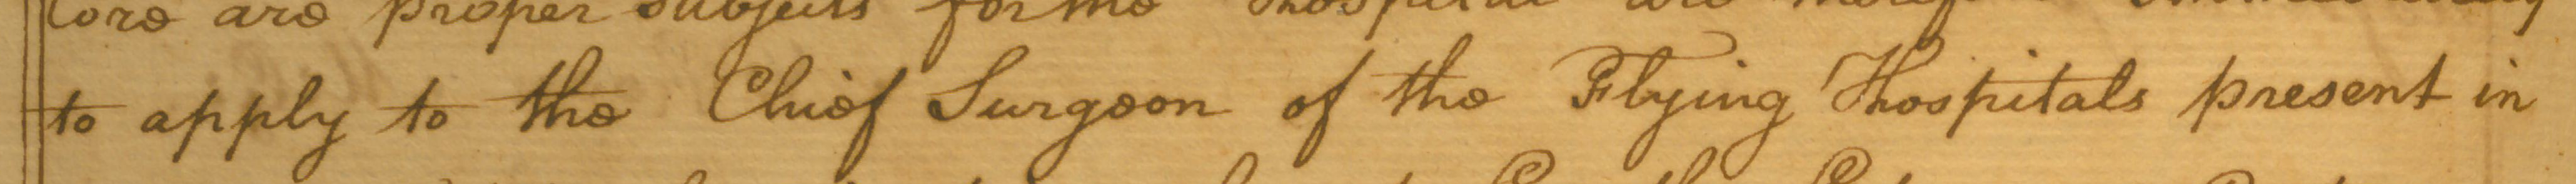to apply to the Chief Surgeon of the Flying Hospitals present in
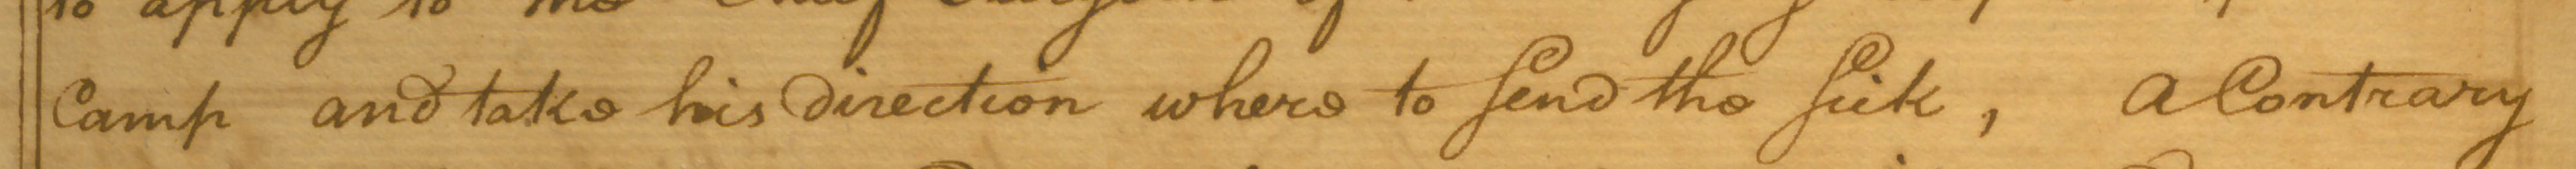camp and take his direction where to send the sick, A Contrary
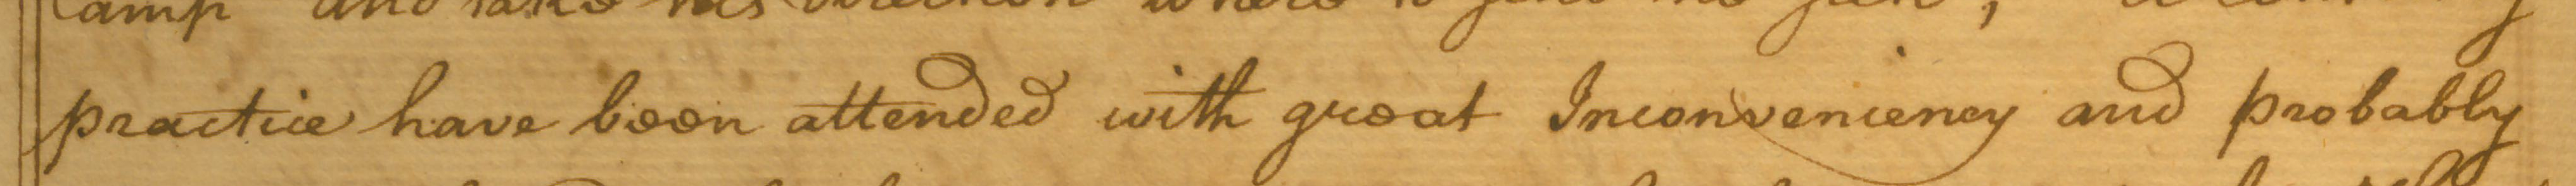practice have been attended with great Inconveniency and probably
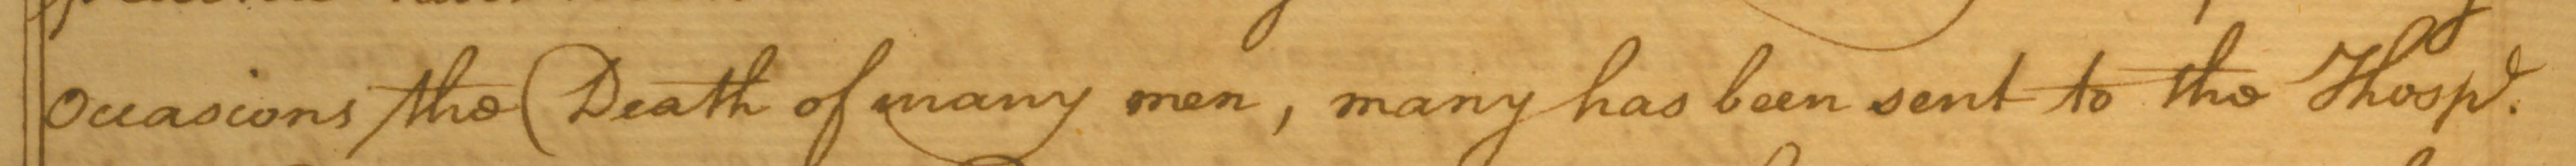occasions the Death of many men, many has been sent to the Hosp^l.
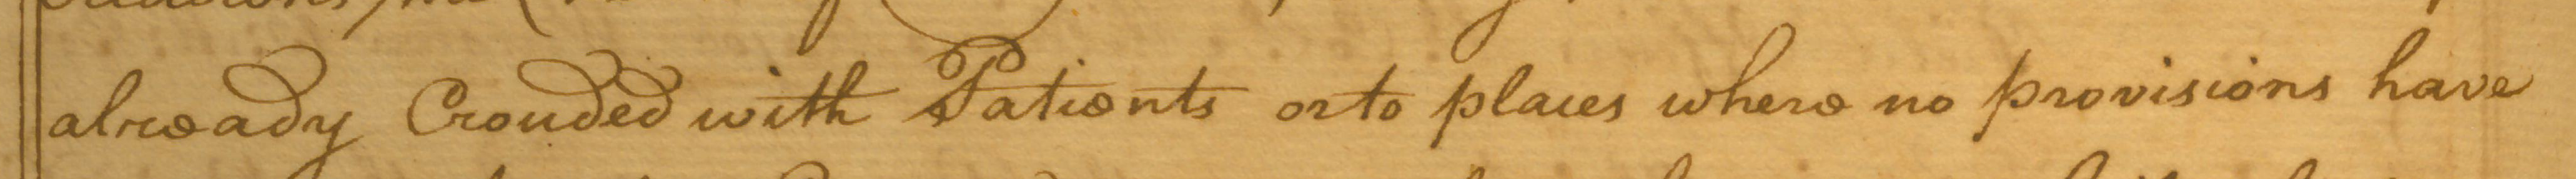already crouded with Patients or to places where no provisions have
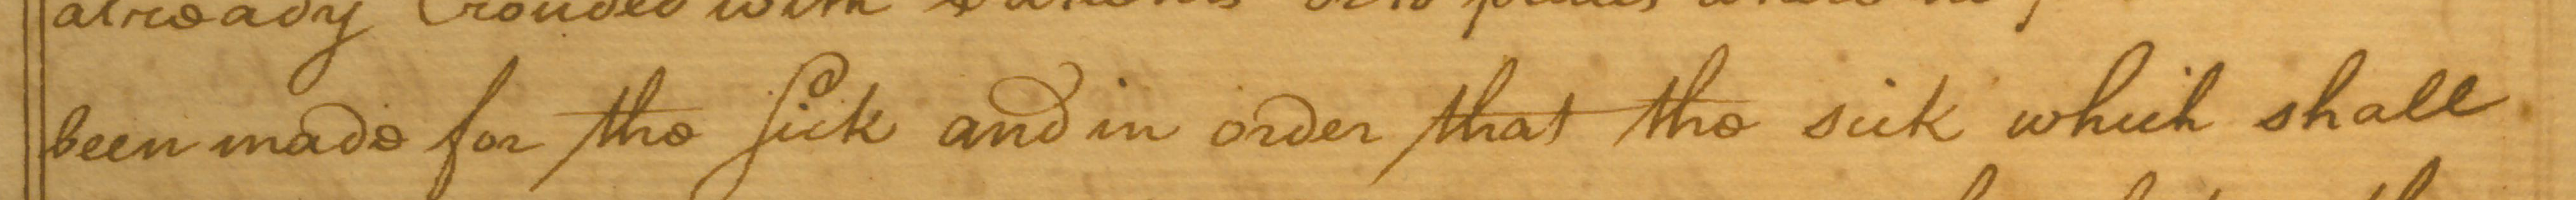been made for the Sick and in order that the sick which shall
